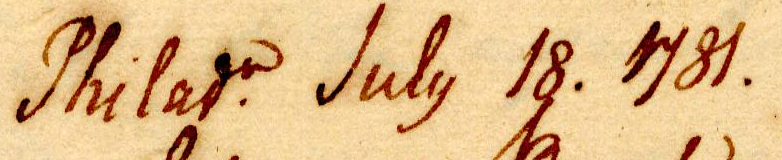Philad^a July 18 1781
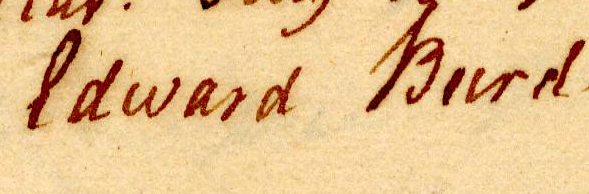Edward Burd
